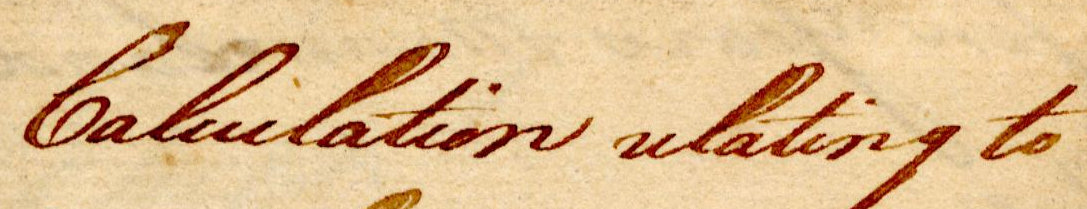Calculation relating to
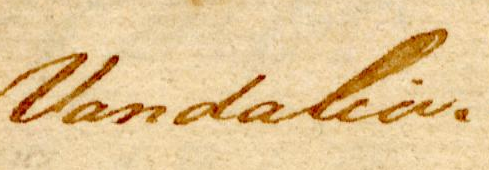Vandalia
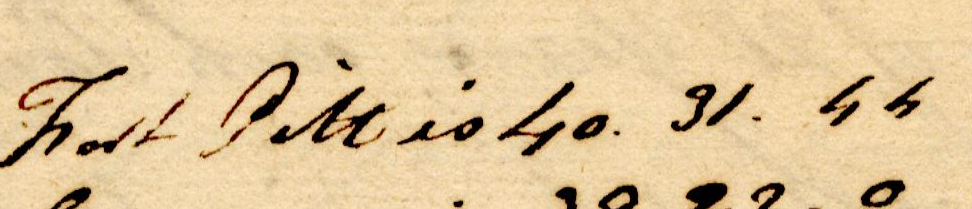Fort Pitt is 40.31.44
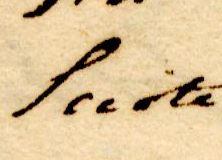Scaota
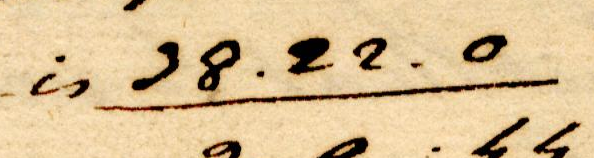is 38.22.0
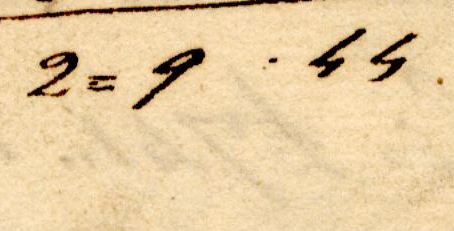2-9.44
